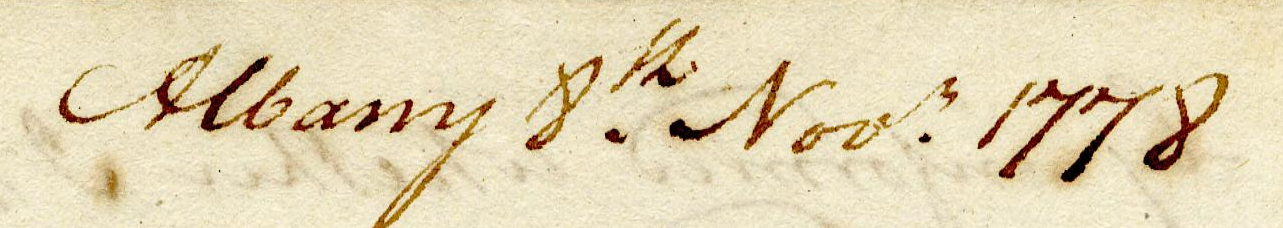Albany 8^th. Nov^r. 1778
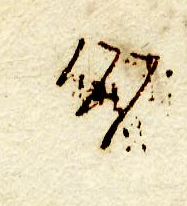177
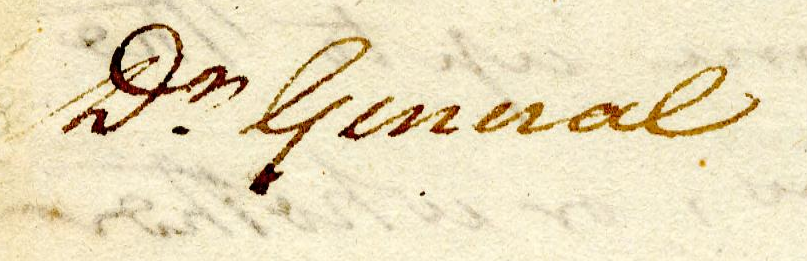D^r. General
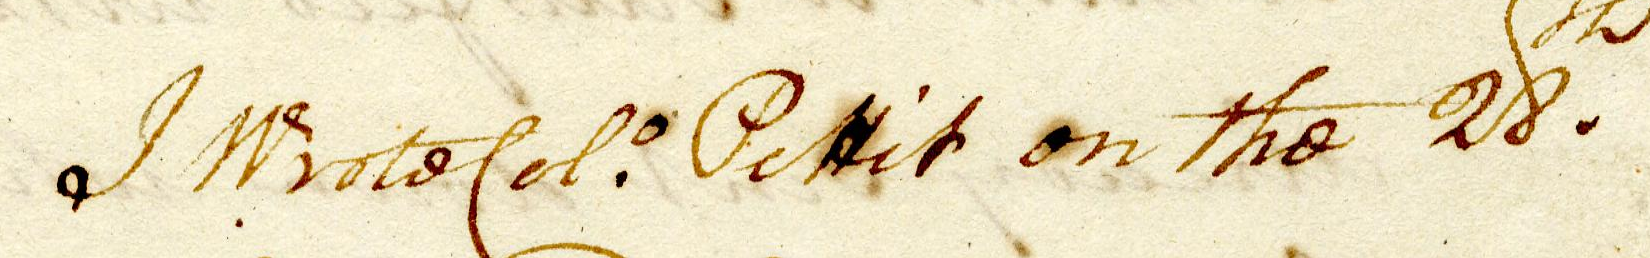I Wrote Col^o. Pettit on the 28^th.
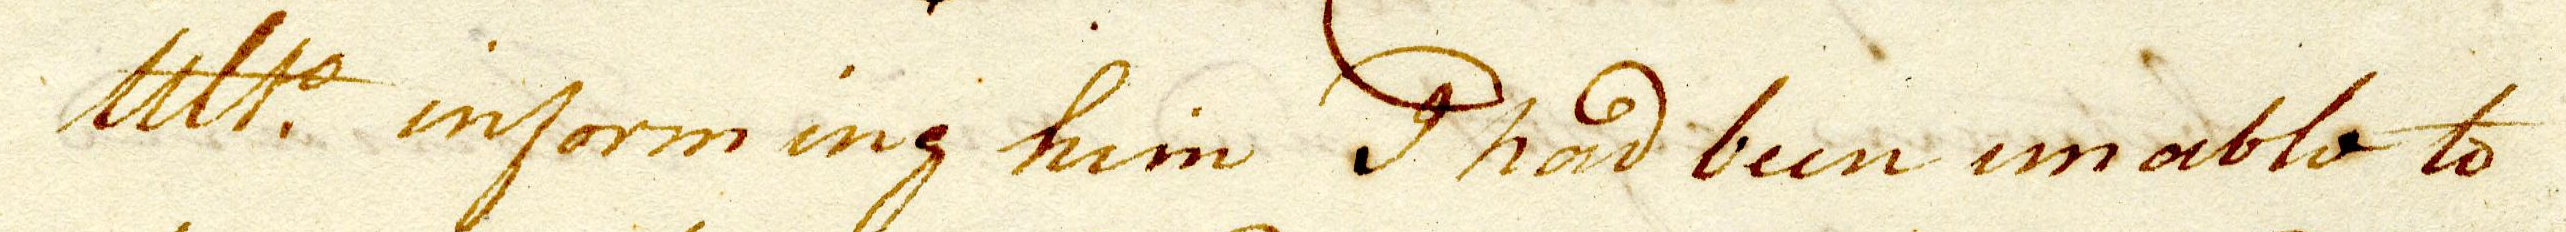Ult^o. informing him I had been unable to
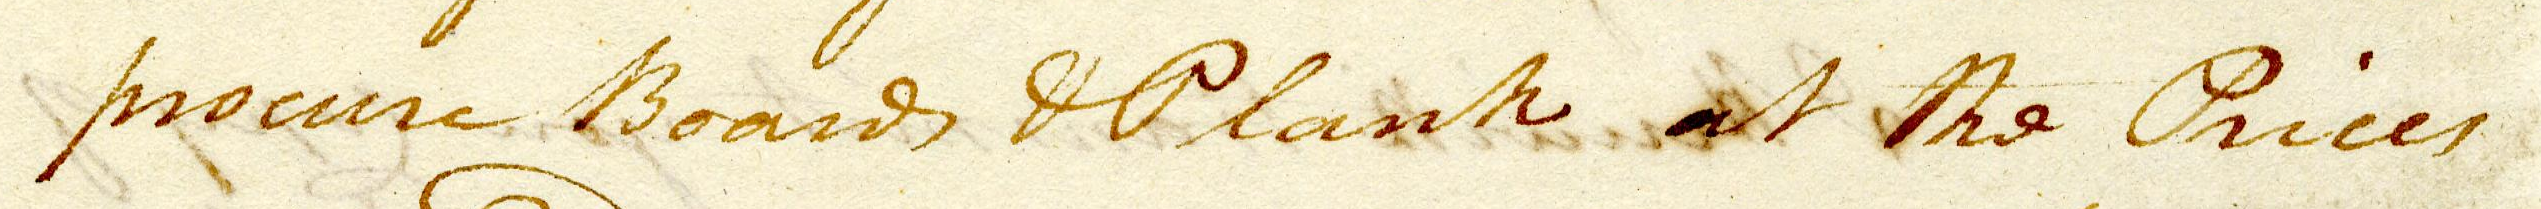procure Boards & Plank at the Prices
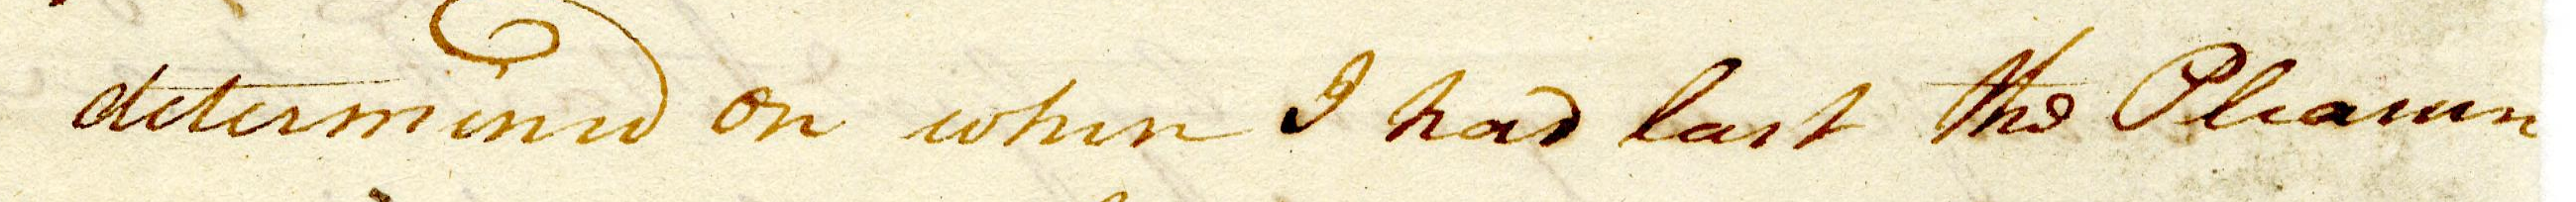determined on when I had last the Pleasure
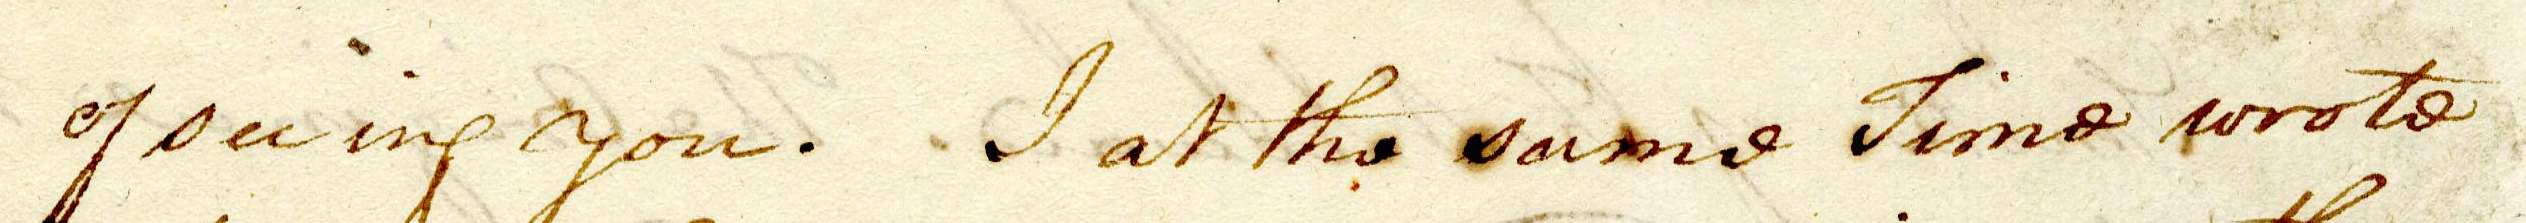of seeing you. I at the same Time wrote
